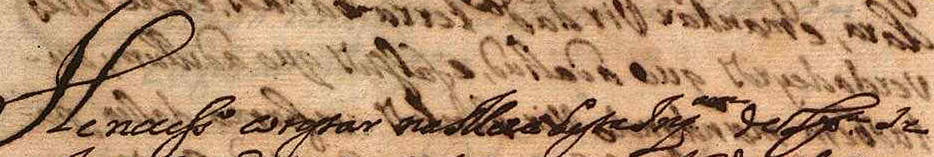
He necesso constar na Meza desta Inq.am de Lx.a se
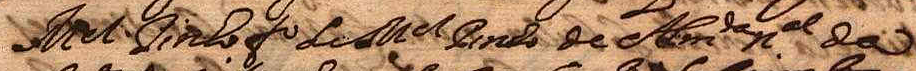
Mel Pinho fo de M.el Pinho de Almda n.al da
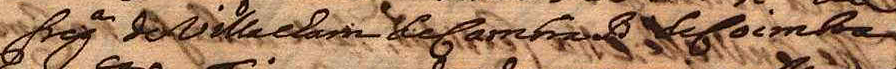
freg.a de villa cham de Cambra Bo de Coimbra
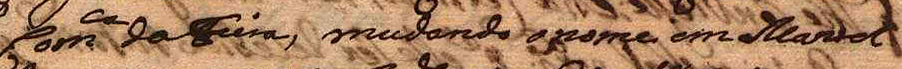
Comca da Feira, mudando o nome em Manoel
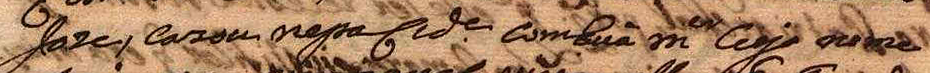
Joze, cazou nesta Cid.e com huā mer cuyo nome
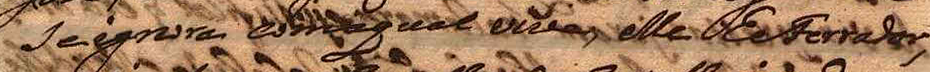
se ignora com a qual vive, elle he Ferrador,
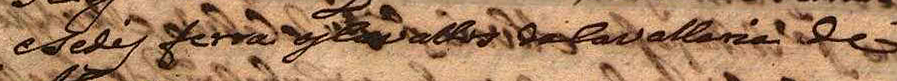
e se dis ferra os cavallos da Cavallaria de
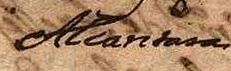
Alcantara
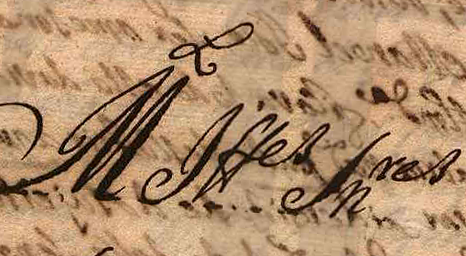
Mto Ilt.es Sn.res
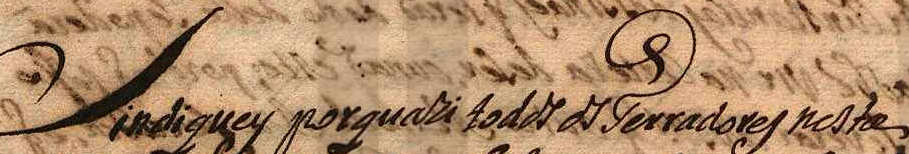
Sindiquey por quazi todos os Ferradores nesta
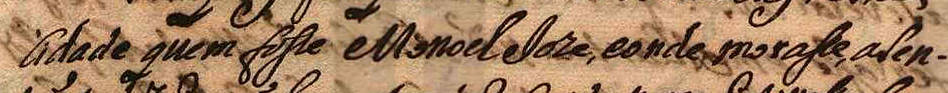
Cidade quem fosse Manoel Ioze, e onde morasse, asen
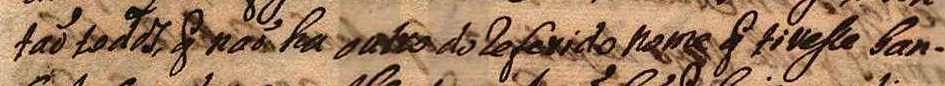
taõ todos, q̄ naõ ha outro do Referido nome q̄ tivesse ban
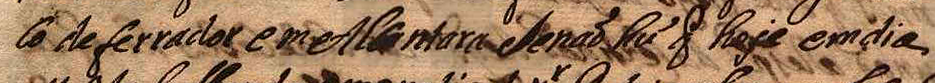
Co de ferrador em Alcantara senaõ hū q̄ hoje em dia
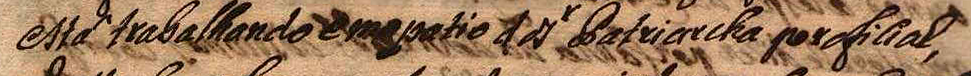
estâ trabalhando em o patio do sr Patriarcha por ofiCial,
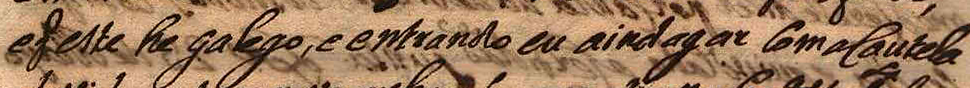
e q̄ este he galego, e entrando eu a indagar Com a Cautela
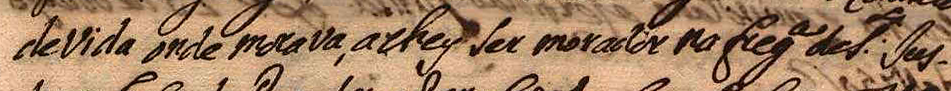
devida onde morava, achey ser morador na frega de S.ta Jus
